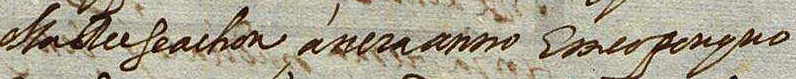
ella Ree se achou, auera anno E meo pouquo
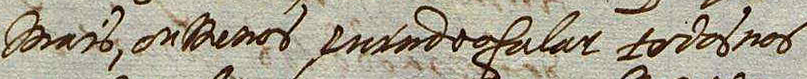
mais, ou menos, e uindo a falar todos nas
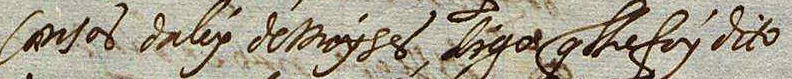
cousas da ley de moyses, digo q̄ lhe foy dito
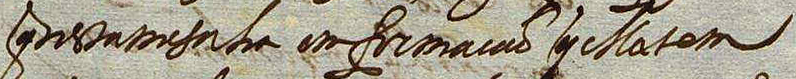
q̄ nesta mesa ha emformacaõ q̄ ella tem
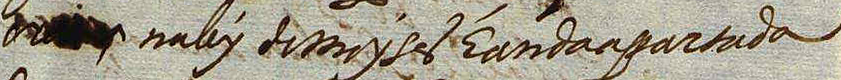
cr____ na ley de moyses E anda apartada
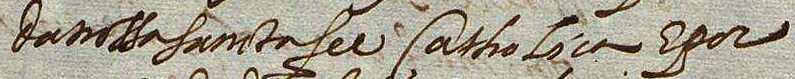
da nossa sancta fee Catholica E por
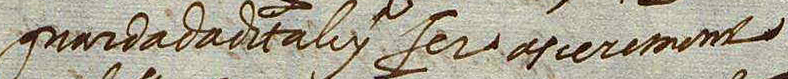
guarda da dita ley fez as ceremone
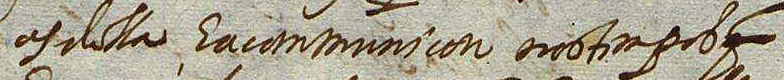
as della E a communicou nos tempos q̄
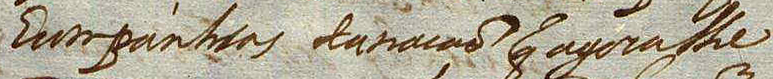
E companhias da naçaõ q agora lhe
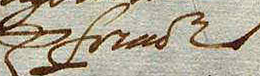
foraõ
